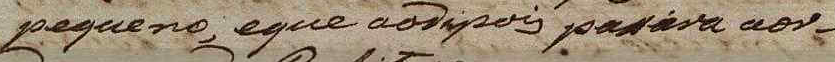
pequeno, e que ao dipois passára a or
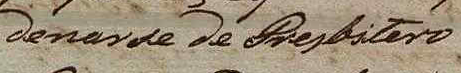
denarse de Presbitero
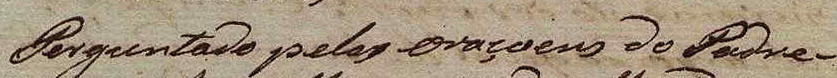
Perguntado pelas oraçoens do Padre
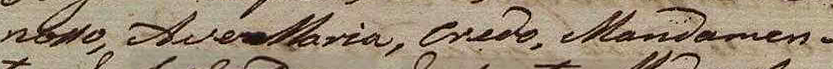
nosso, Ave Maria, credo, Mandamen
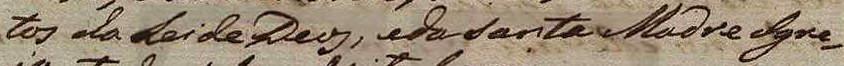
tos da Lei de Deos, e da santa Madre Igre
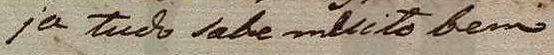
ja tudo sabe muito bem
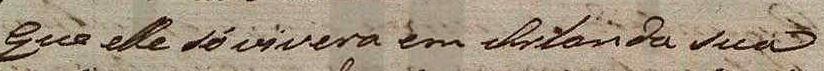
Que elle só vivera em Irlanda sua
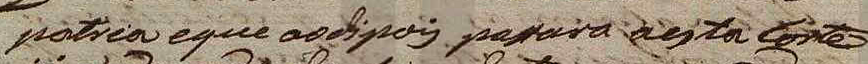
patria e que ao dipois passara a esta Corte
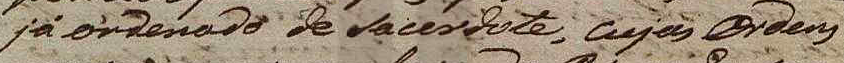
já ordenado de sacerdote, cujas Ordens
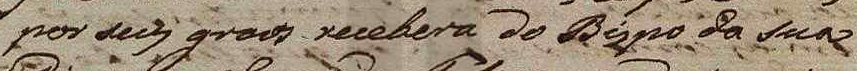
por seus graos recebera do Bispo da sua
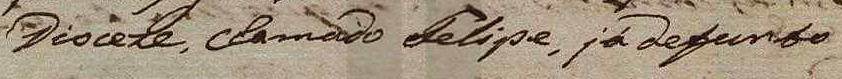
Dioceze, chamado Felipe, já defunto
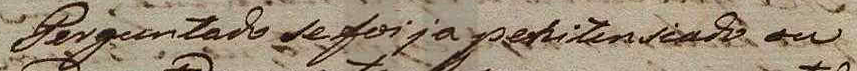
Perguntado se foi ja penitensiado ou
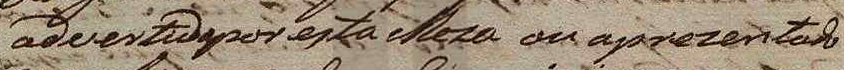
advertido por esta Meza ou aprezentado
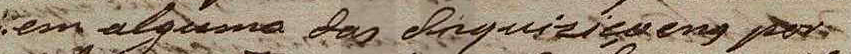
em alguma das Inquiziçoens por
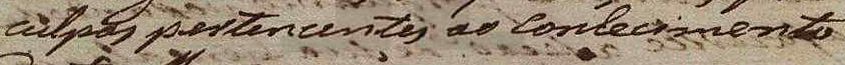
culpas pertencentes ao conhecimento
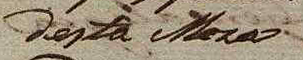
desta Meza
